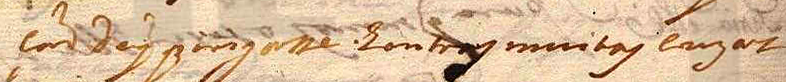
çaõ de q̄ perigasse. E outras muitas couzas
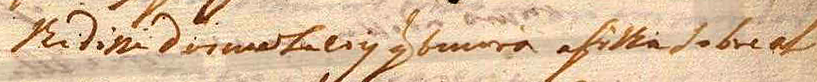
lhe disse disuaelacois q̄ tiuera a filha sobre al
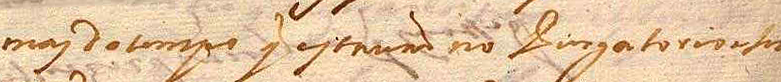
mas do tempo q̄ estavaõ no Purgatorio e su
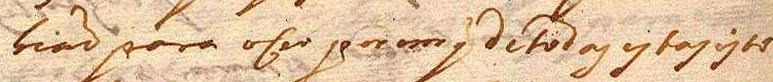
biaõ para o Ceo porem q̄ de todas estas isto
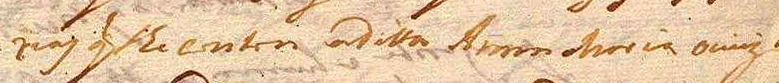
rias q̄ lhe contou a ditta Anna Maria ouuja
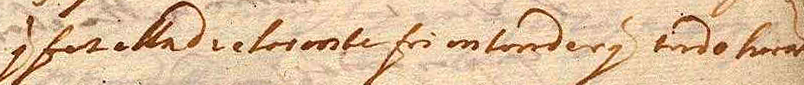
q̄ fez ella declarante foi entender q̄ tudo heraõ
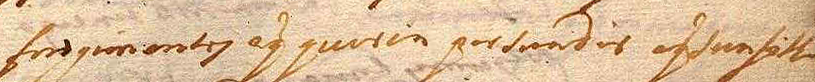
fingimentos e q̄ queria persuadir a q̄ sua filha
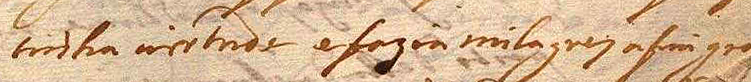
tinha virtude e fazia milagres afim gra
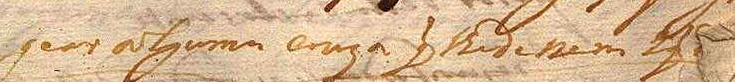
gear alguma couza q̄ lhe dessem e q̄ o
